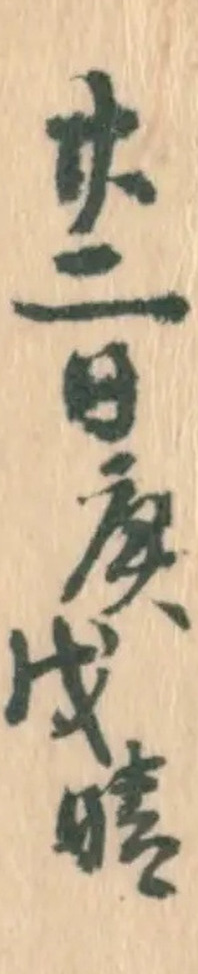廿二日庚戌晴
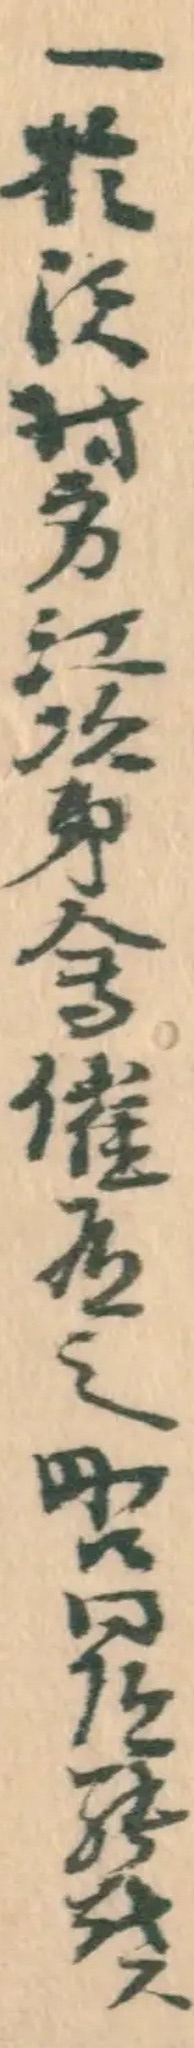一於沢村方江次第会催有之町口同道罷越ス
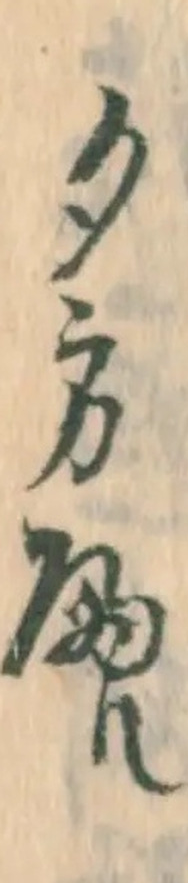夕方帰ル
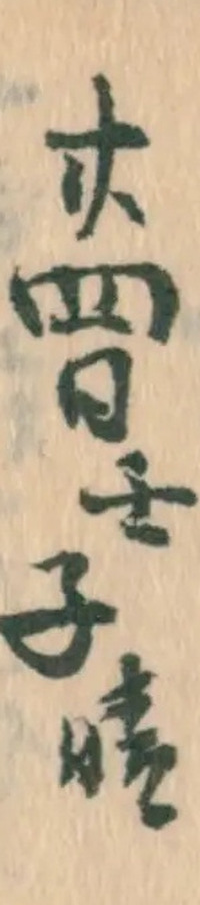廿四日壬子晴
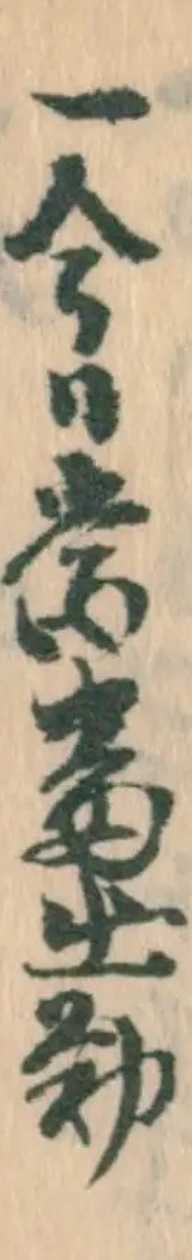一今日当番出勤
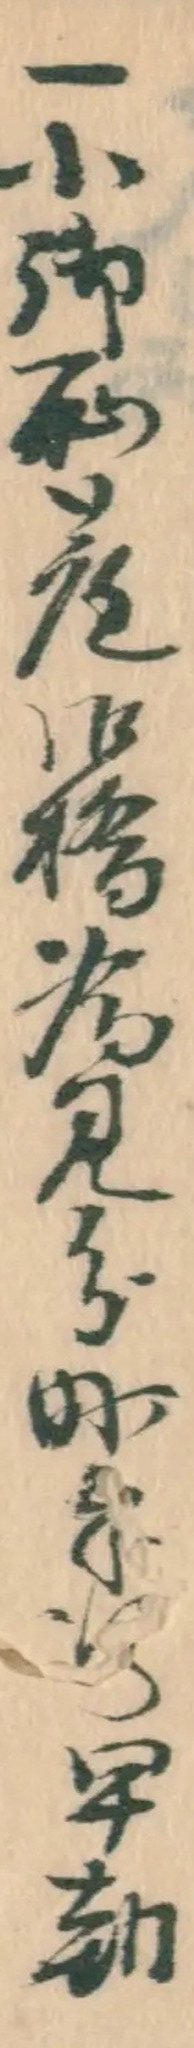一小御所御庭御橋為見分町奉行早朝
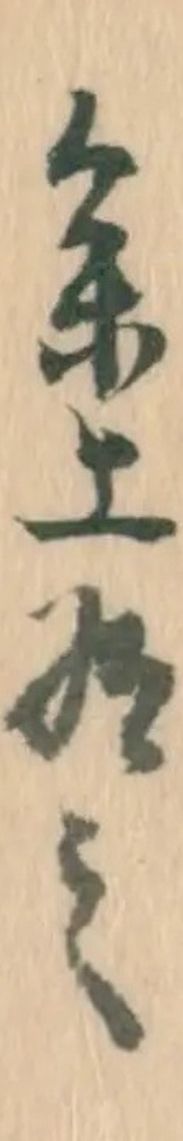参上有之
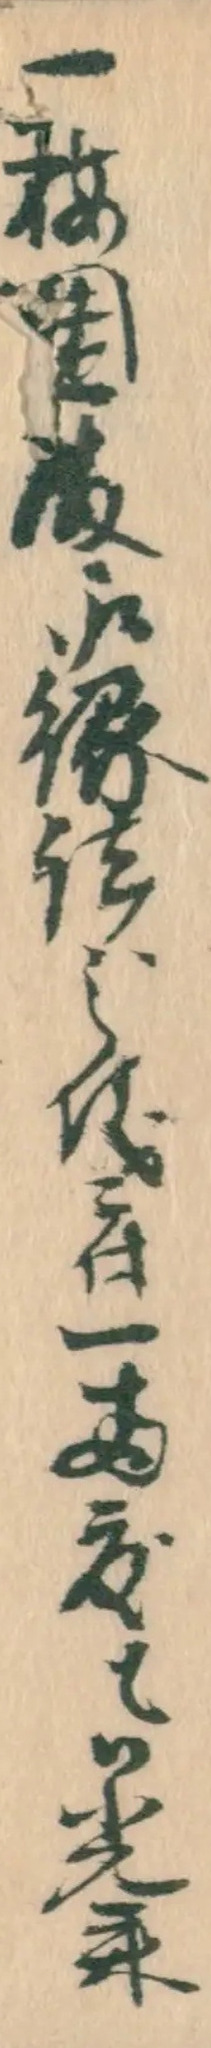一梅園殿御縁法之儀ニ付一両度も御光来
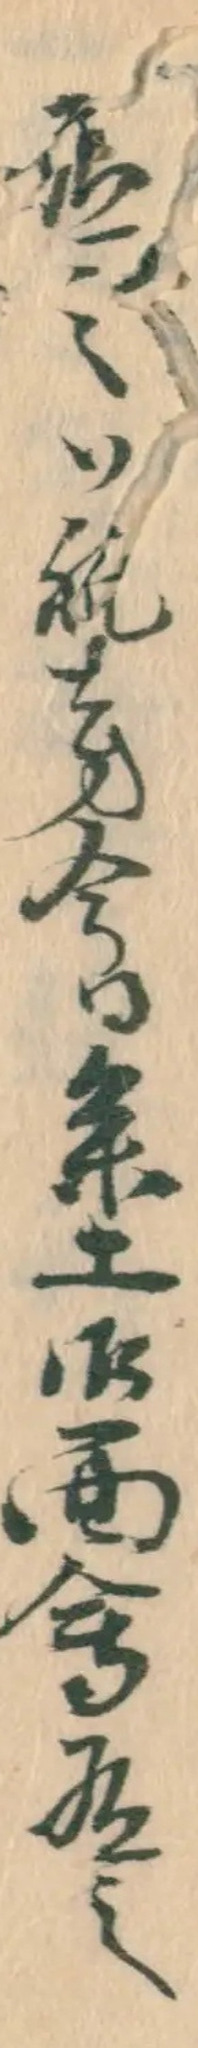有之御祝旁今日参上御面会有之
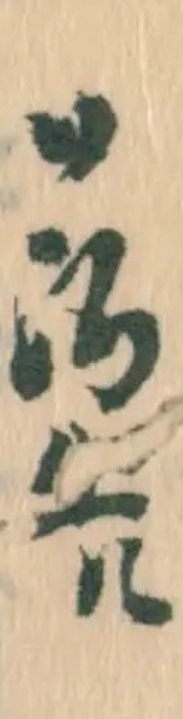御酒出ル
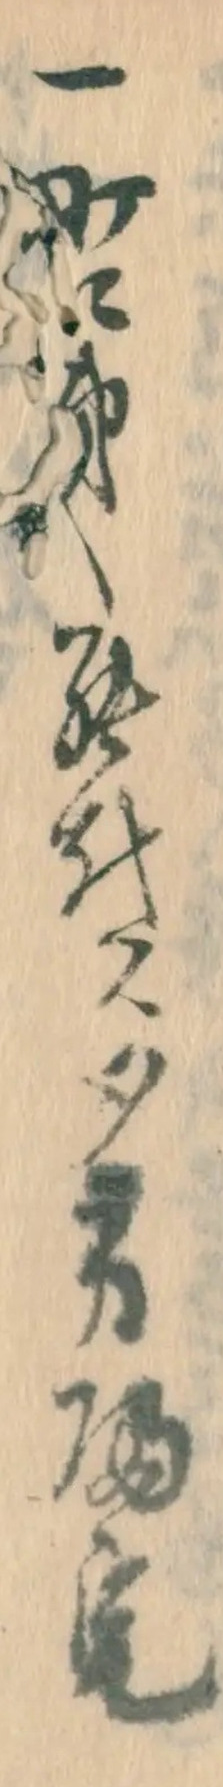一町口第へ罷越ス夕方帰宅
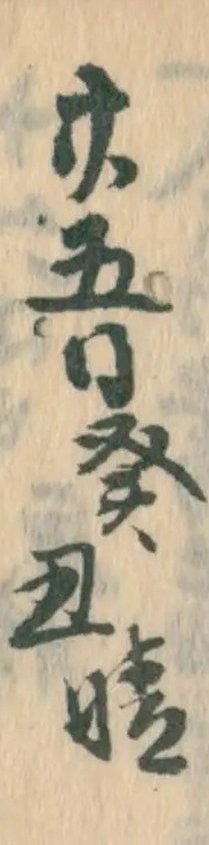廿五日癸丑晴

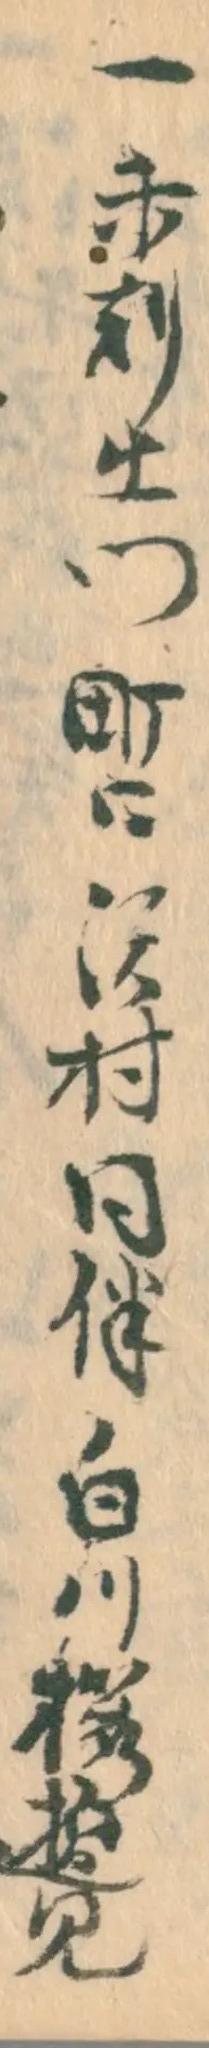一未刻出門町口沢村同伴白川桜遊見
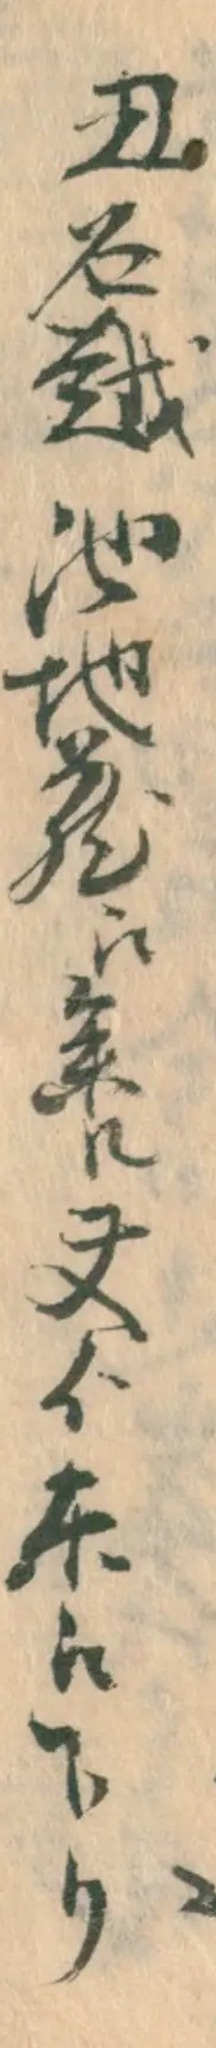且名越池地蔵え参ル夫ゟ東え下り
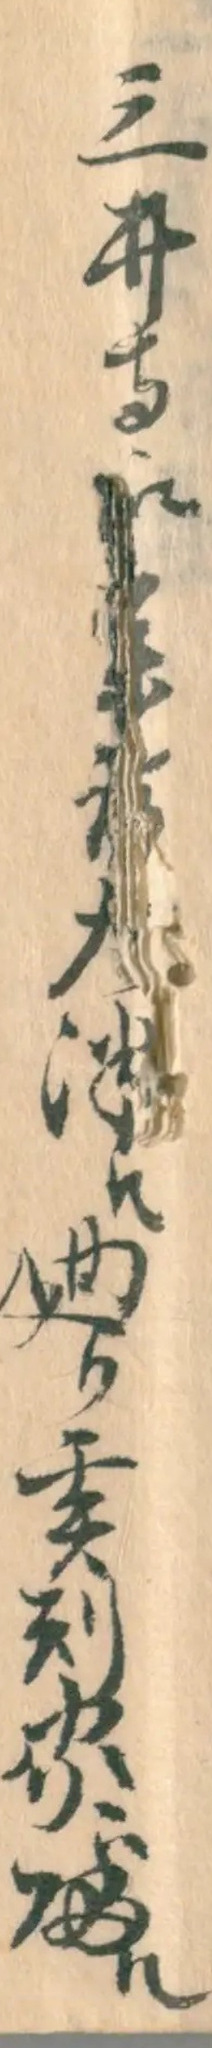三井寺え参詣大津え廻り亥刻家え帰ル
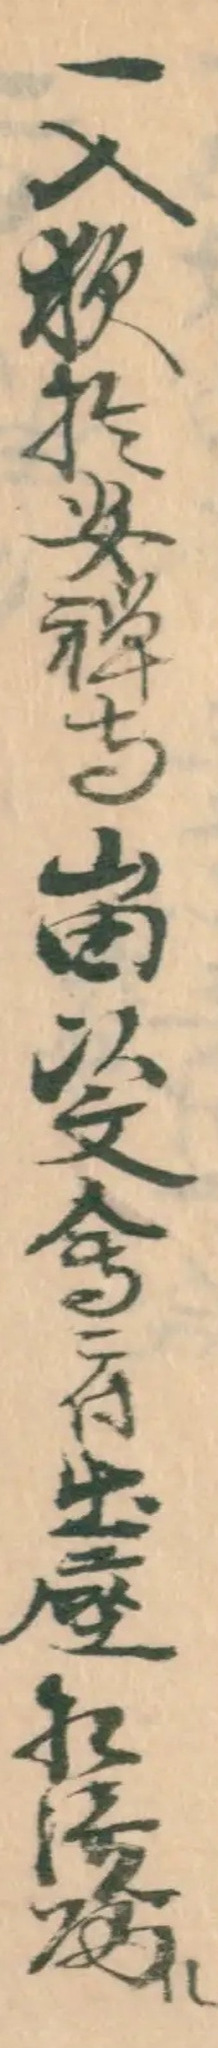一入夜於安禅寺山田以文会ニ付出座相済帰ル
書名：禁裏御所御用日記. [131]
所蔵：国立国会図書館 National Diet Library, JAPAN
